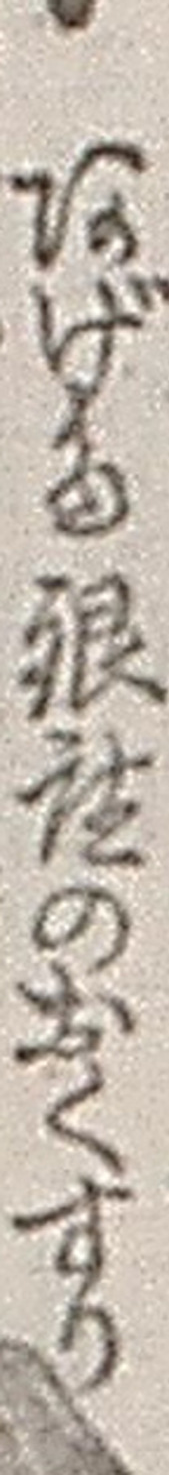あげた銀座のおくすり
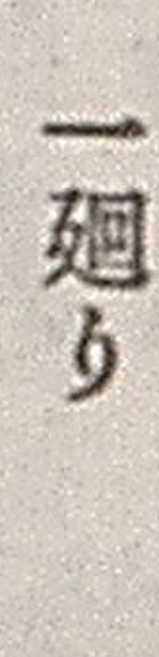一廻り
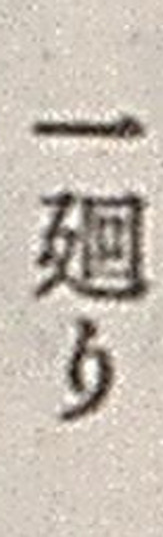一廻り
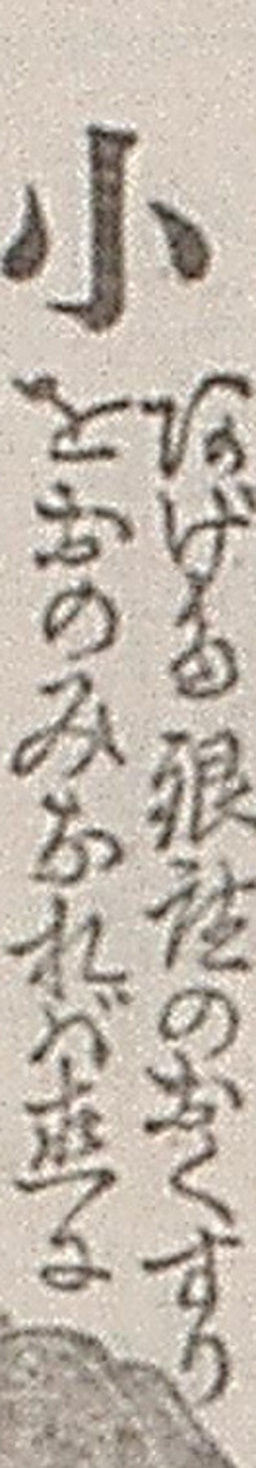をおのみなれば直に
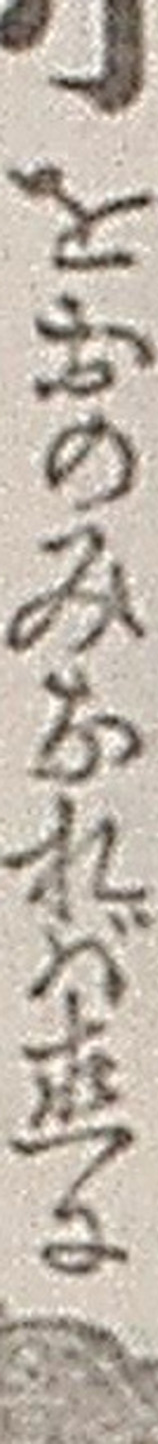をおのみなれば直に
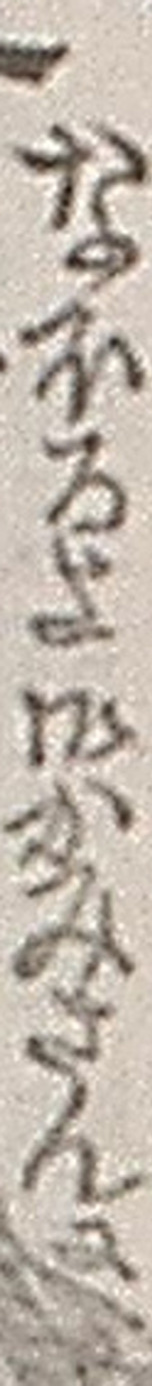なほるよ御かみさんに
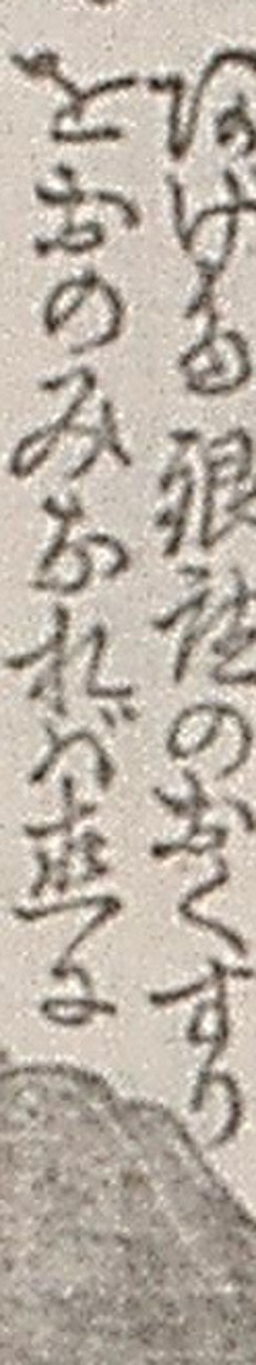をおのみなれば直に
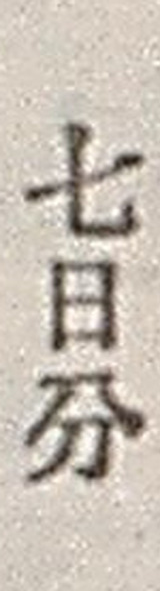七日分
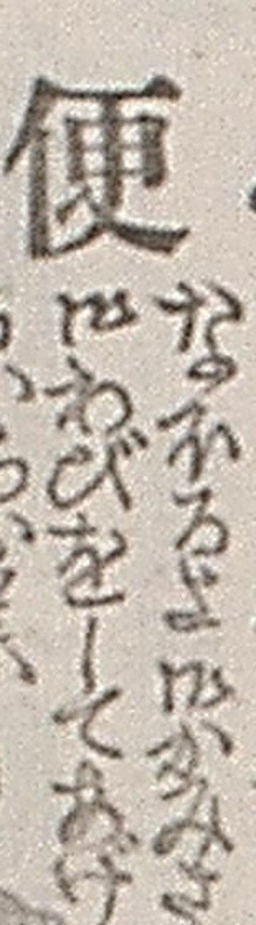御わびをしてあげ
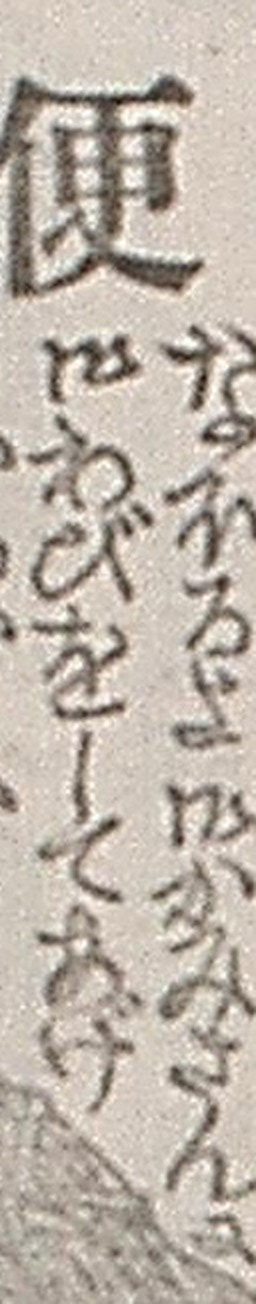御わびをしてあげ
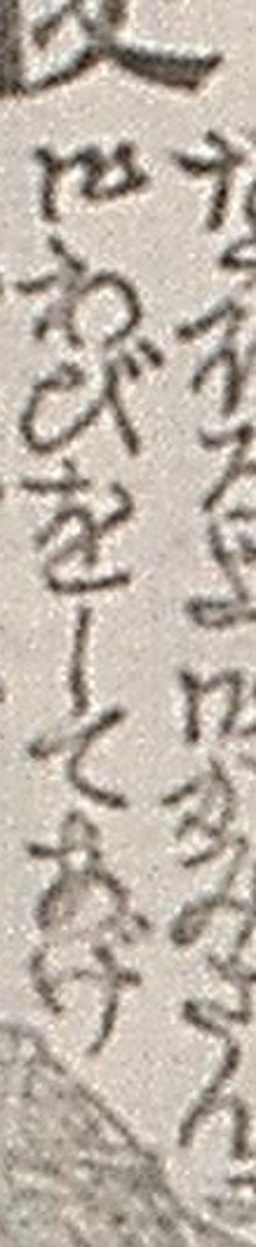御わびをしてあげ
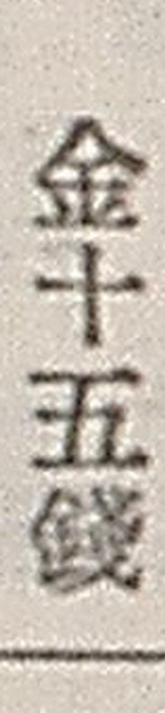金十五銭
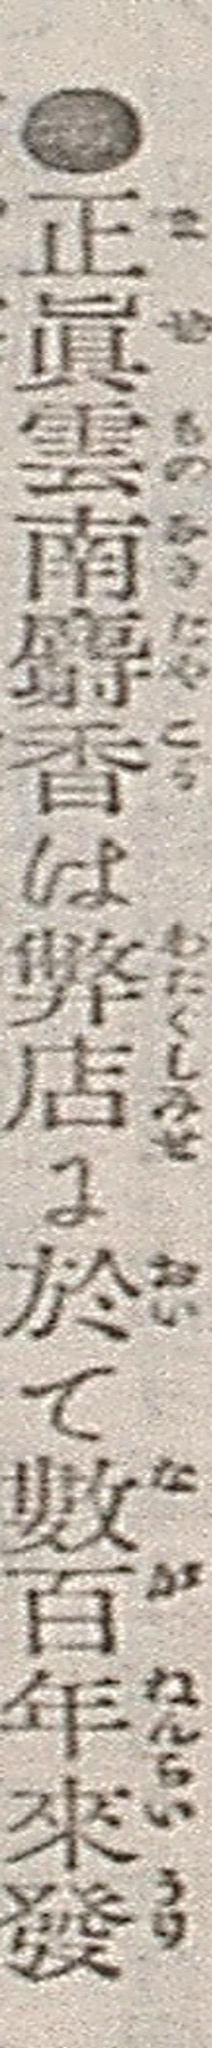●正真雲南麝香は弊店に於て数百年來発
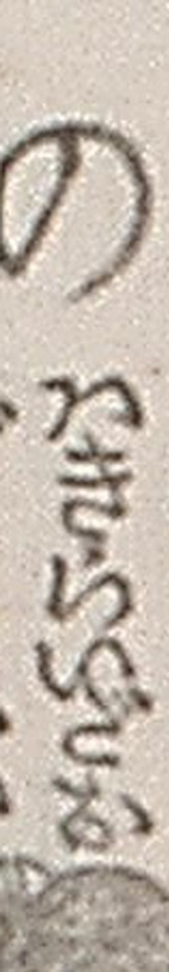はきらいだお
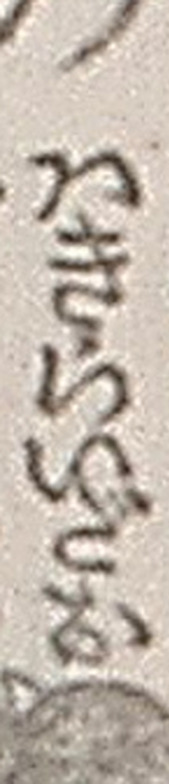はきらいだお
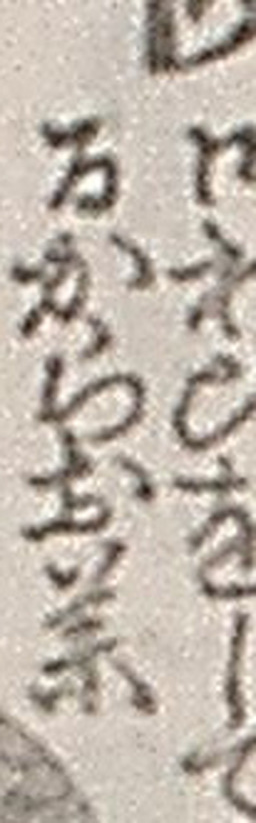るからお薬
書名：風俗畫報臨時増刊第百二十六號　洪水被害録（中）
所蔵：東京大学地震研究所図書室 Earthquake Research Institute Library, The University of Tokyo, JAPAN
